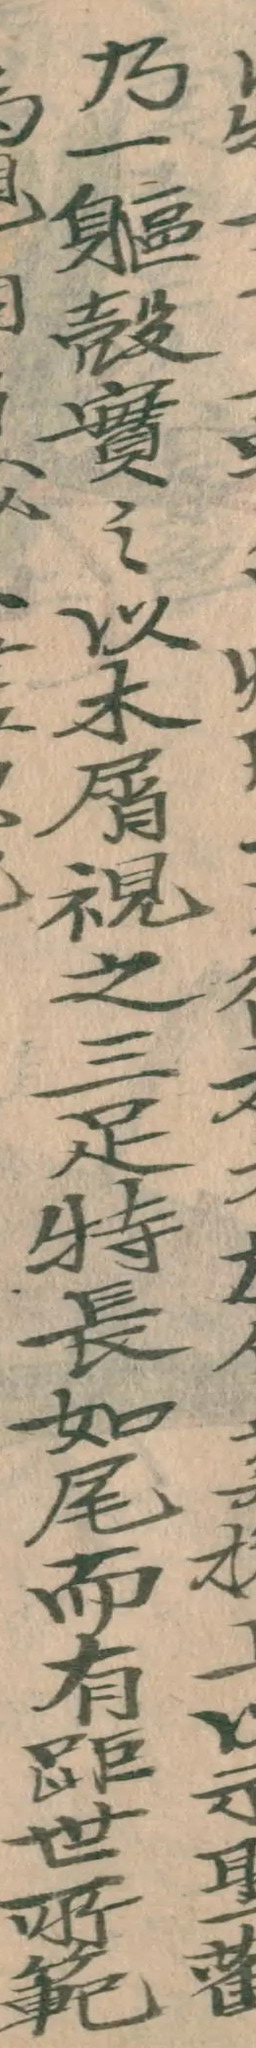乃一軀殻實之以木屑視之三足特長如尾而有距世所範
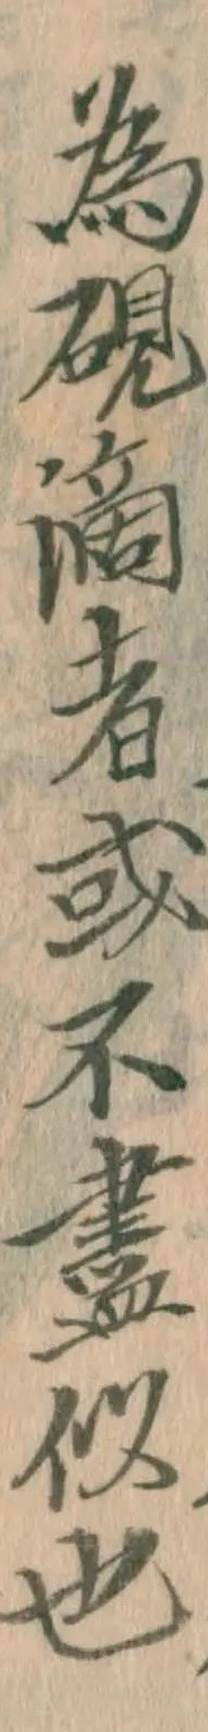為硯滴者或不盡似也
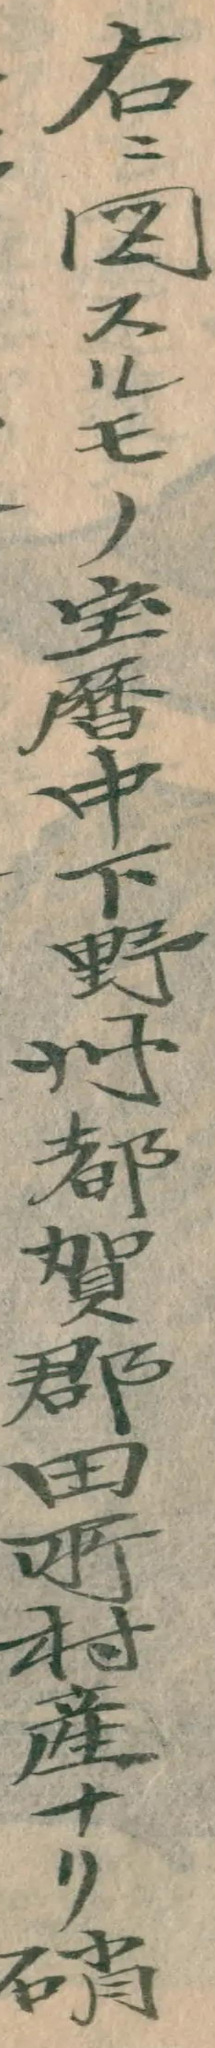右ニ図スルモノ宝暦中下野州都賀郡田所村産ナリ硝
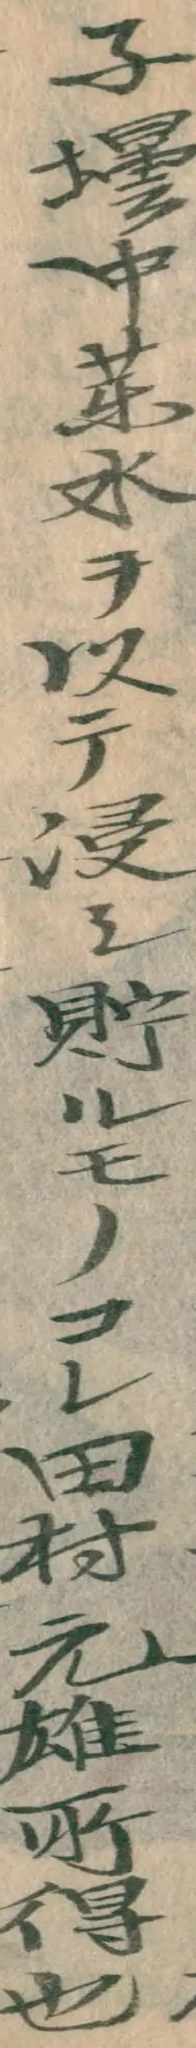子壜中薬水ヲ以テ浸シ貯ルモノコレ田村元雄所得也
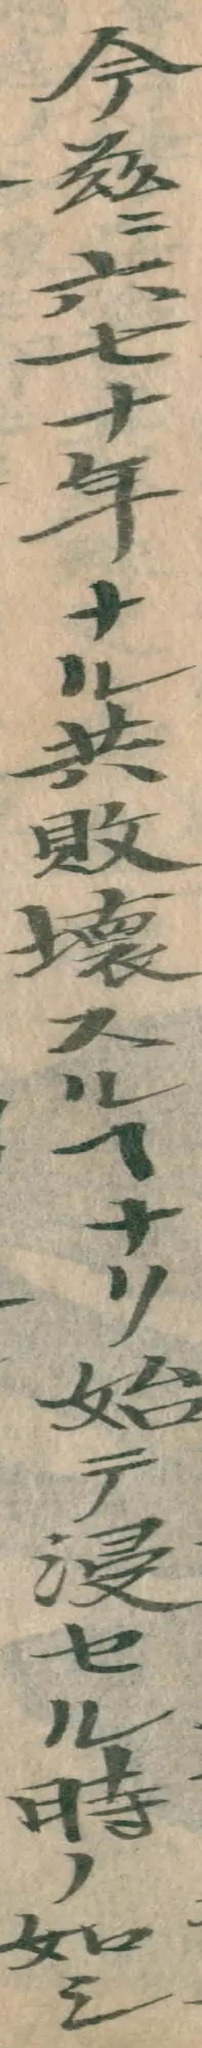今茲ニ六七十年ナル共敗壊スルコトナク始テ浸セル時ノ如シ
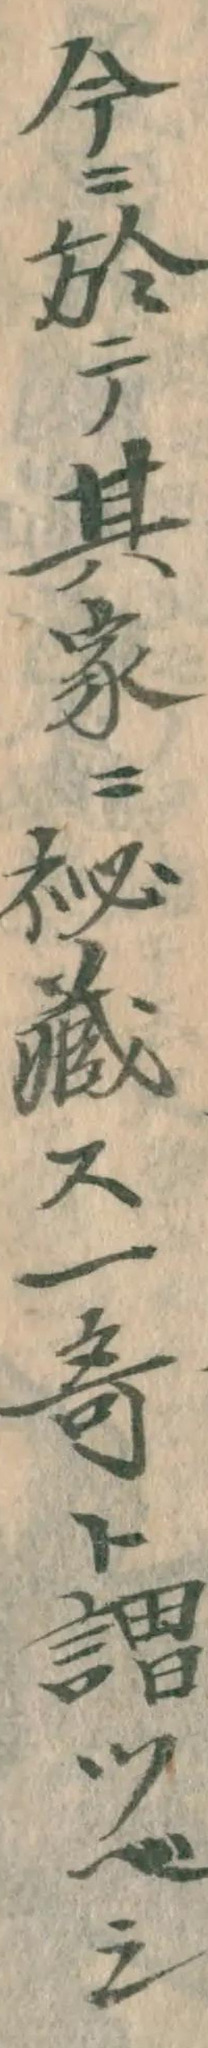今ニ於テ其家ニ秘藏ス一奇ト謂ツベシ

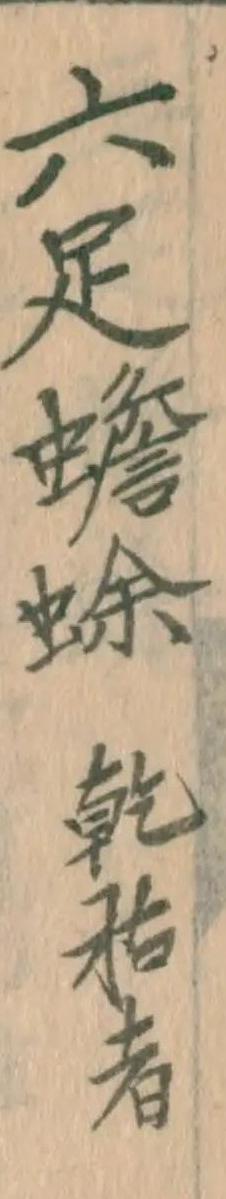六足蟾蜍乾枯者
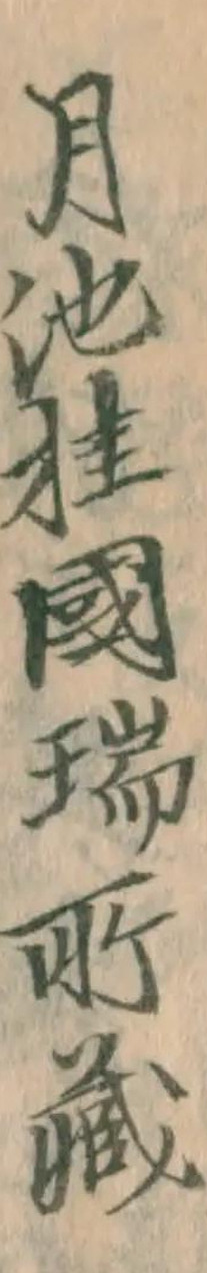月池桂國瑞所藏
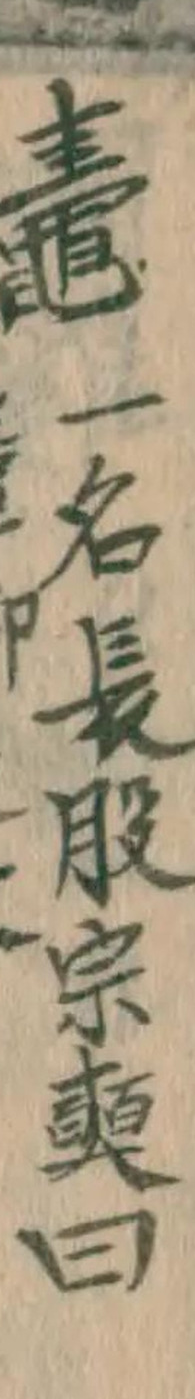鼃一名長股宗奭曰
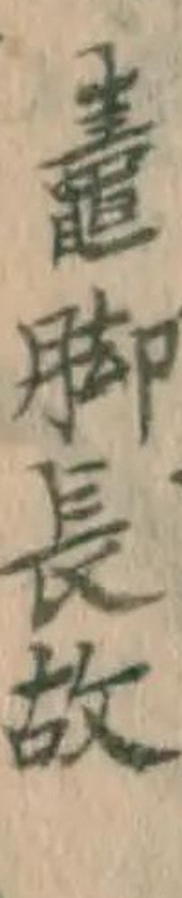鼃脚長故
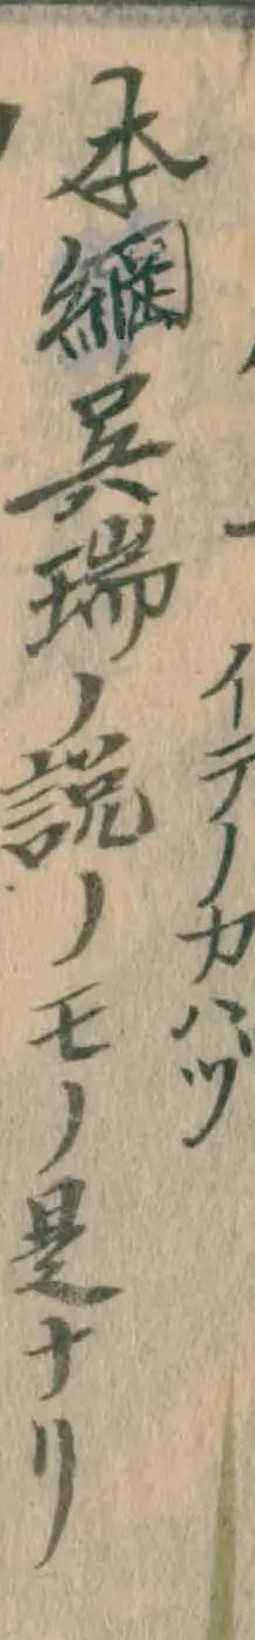本綱呉瑞ノ説ノモノ是ナリ
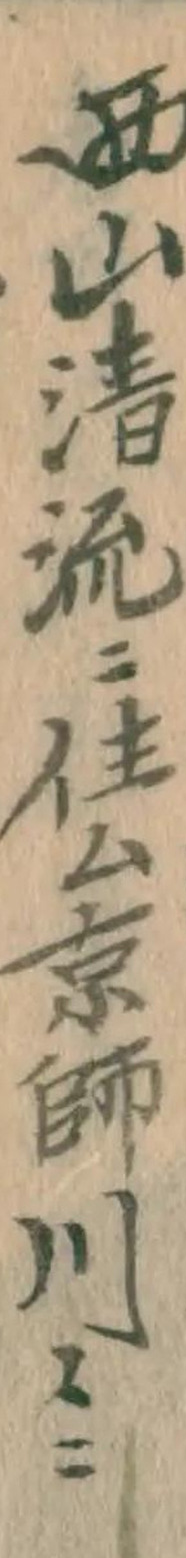西山清流ニ住ム京師川々ニ
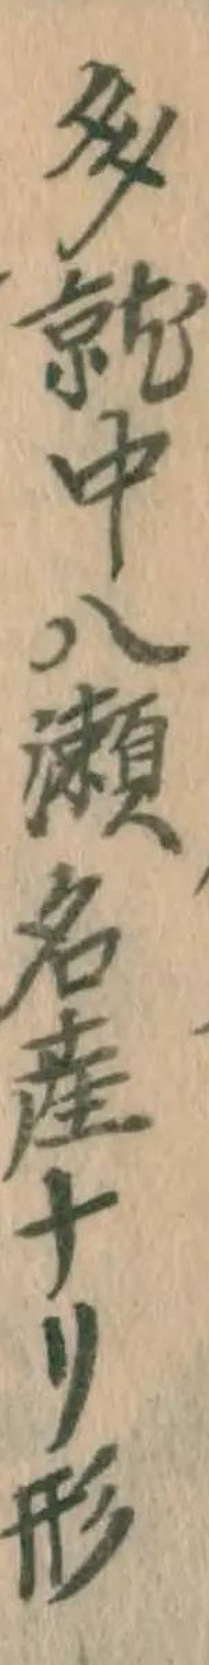多就中八瀬名産ナリ形
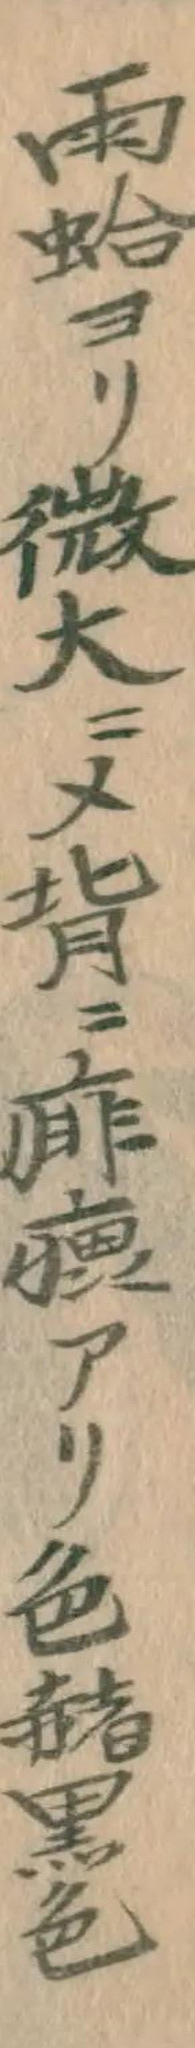雨蛤ヨリ微大ニシテ背ニ痱㿔アリ色赭黒色
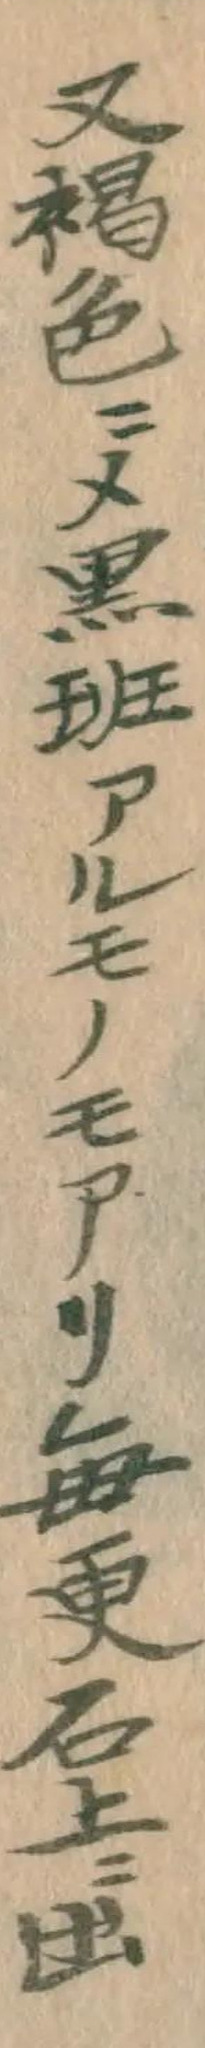又褐色ニシテ黒班アルモノモアリ毎更石上ニ出
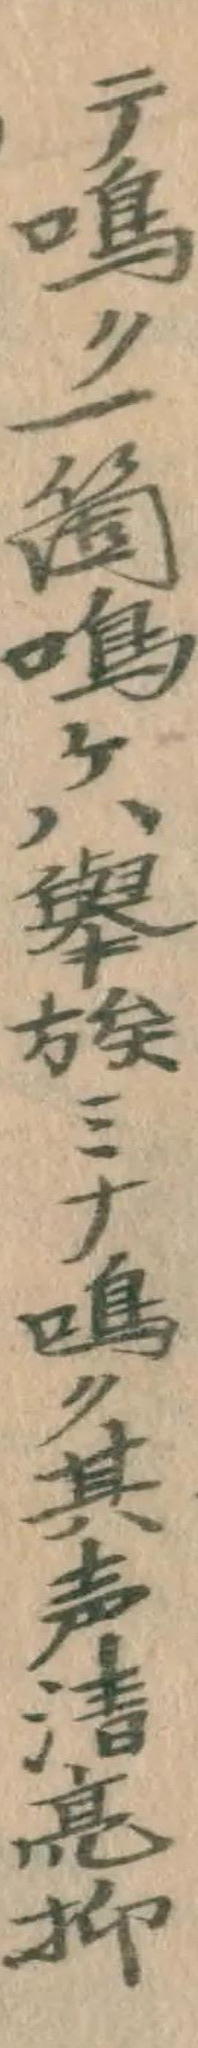テ鳴ク一箇鳴ケハ擧族ミナ鳴ク其声清亮抑
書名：千蟲譜 3巻. [1]
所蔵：国立国会図書館 National Diet Library, JAPAN
